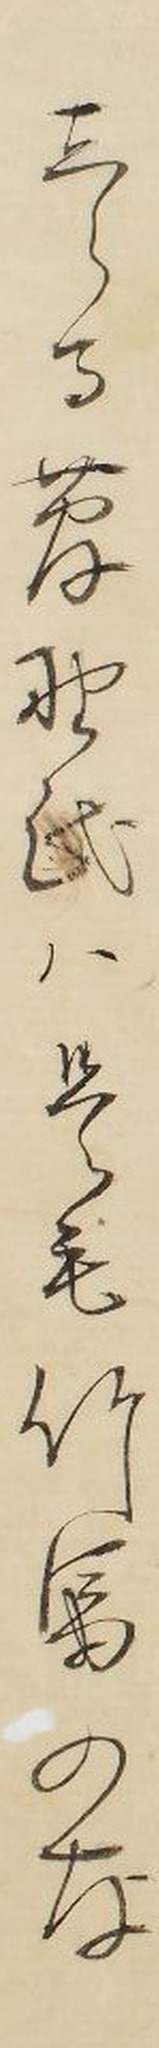しらる菅野氏は是も竹馬の友
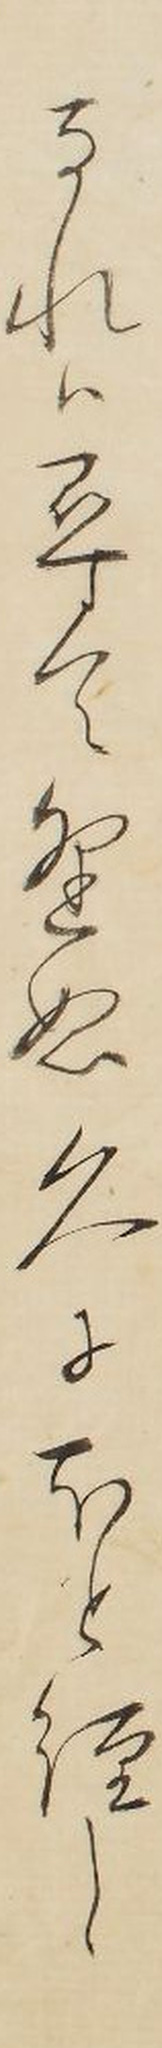なれは尋て逢ぬ久にほと経し
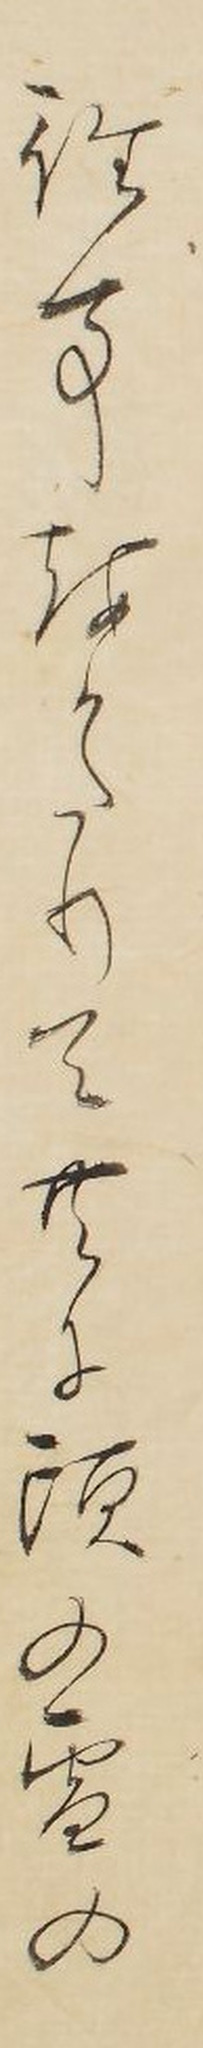往事をかたりて共に頭の雪の
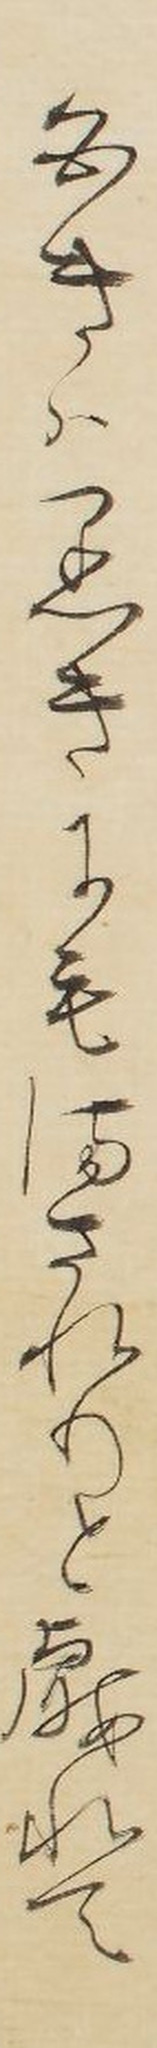白きは黒きにもまされりと戯れて

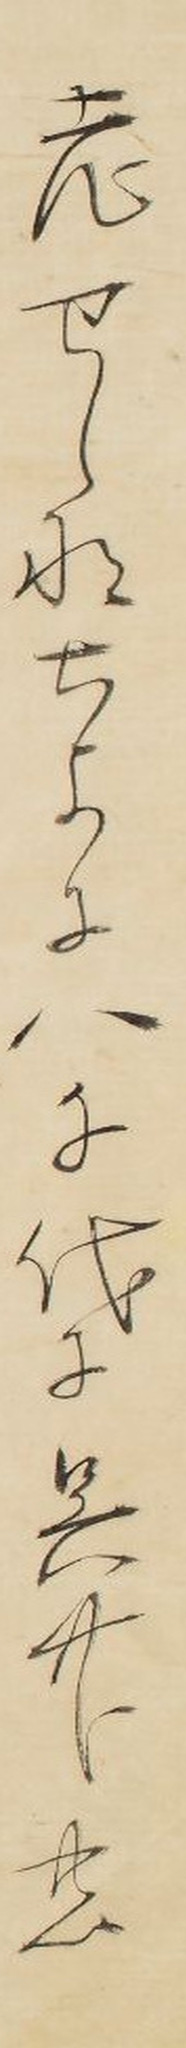老せしなちよに八千代に呉竹の
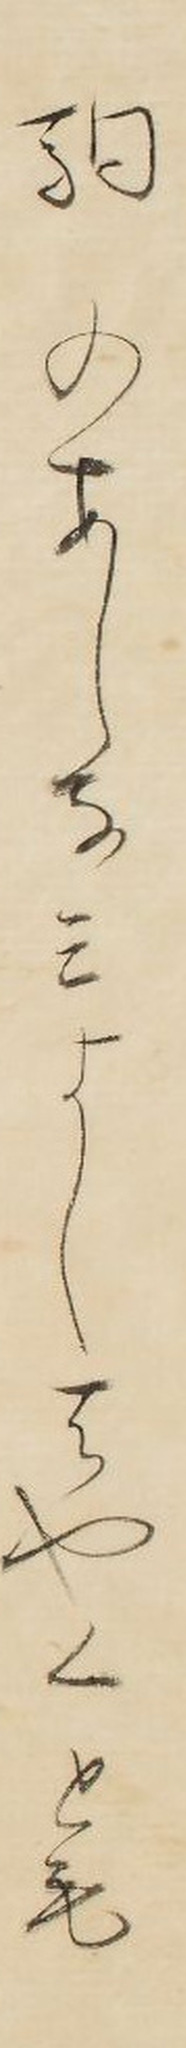駒のあしなみよしはやくとも
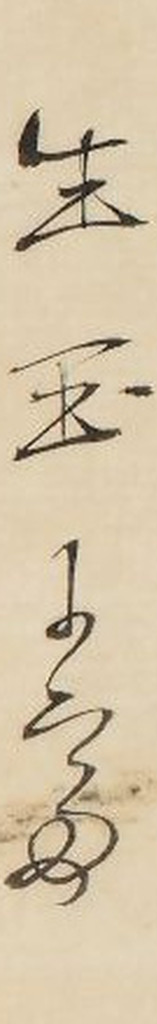生玉にて
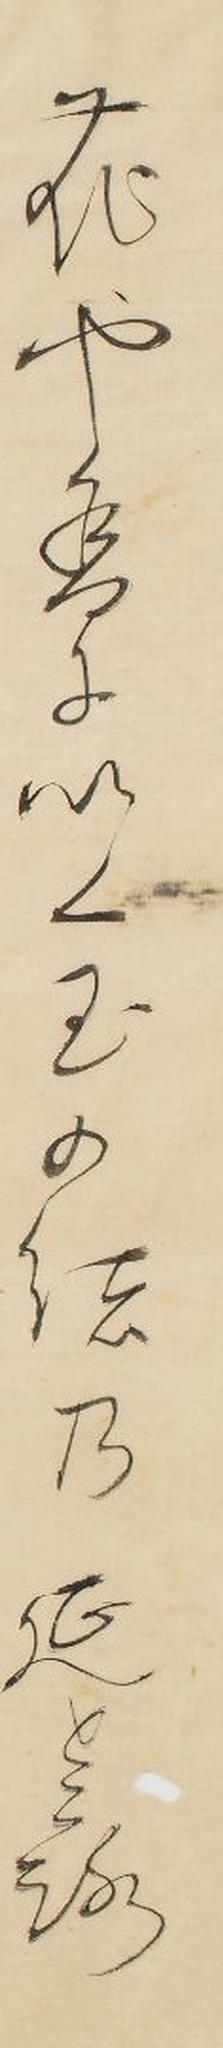花や香にいく玉の緒の延ところ
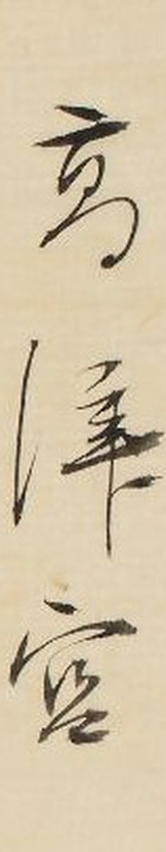高津宮
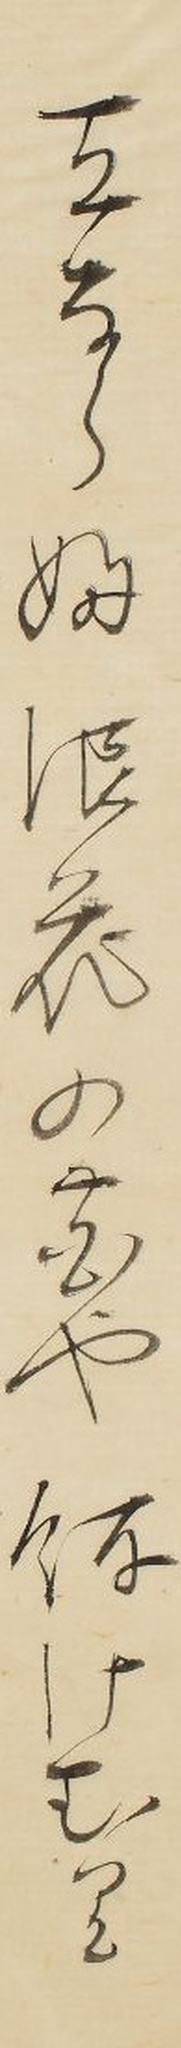立ならふ浪花の花や飯けむり
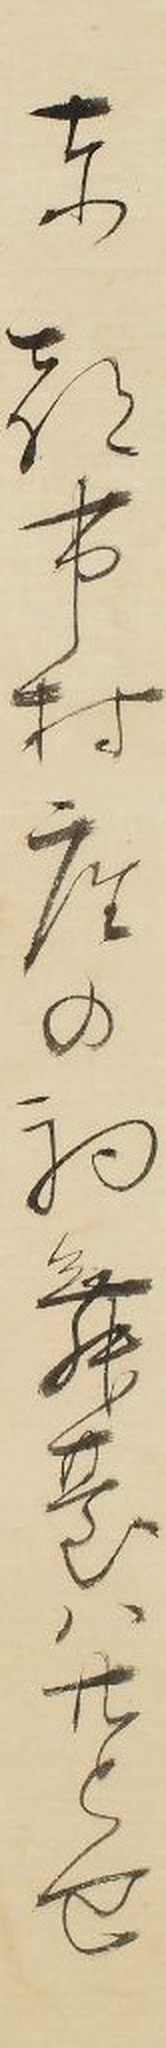東都市村座の初舞台は廿とせ
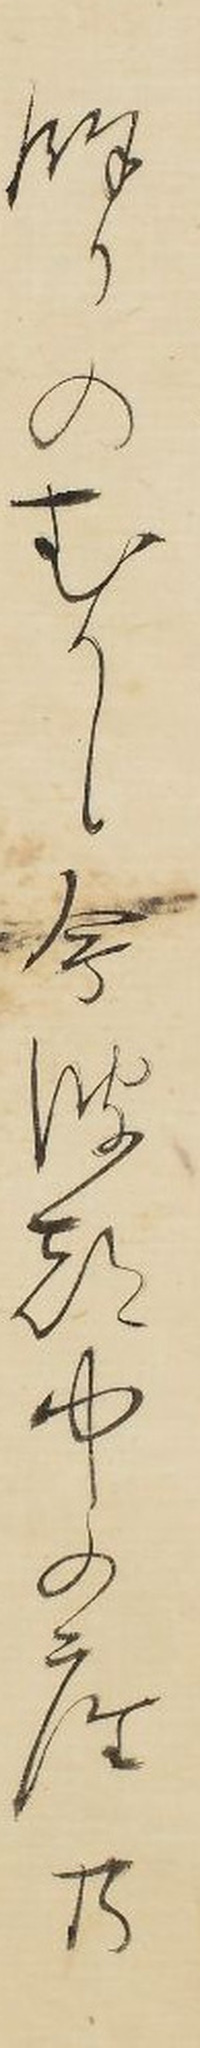余りのむかし今彼都中の座の
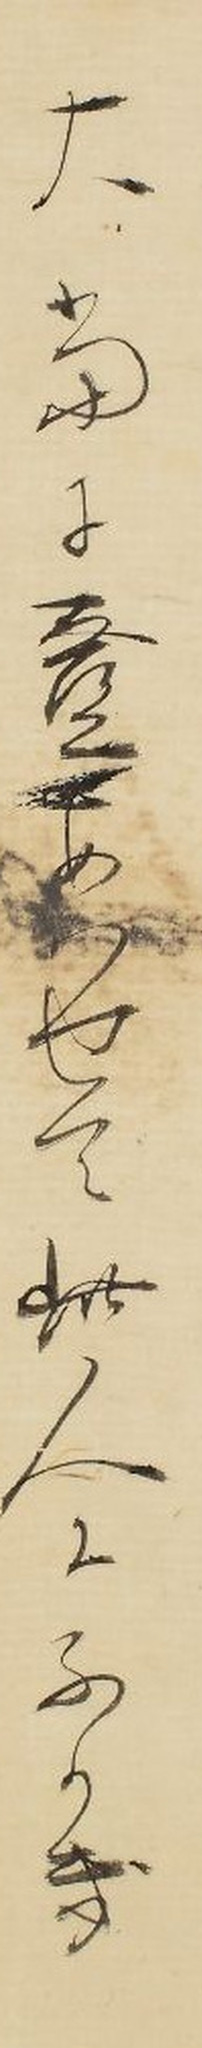大当に登あはせて此人にふかき
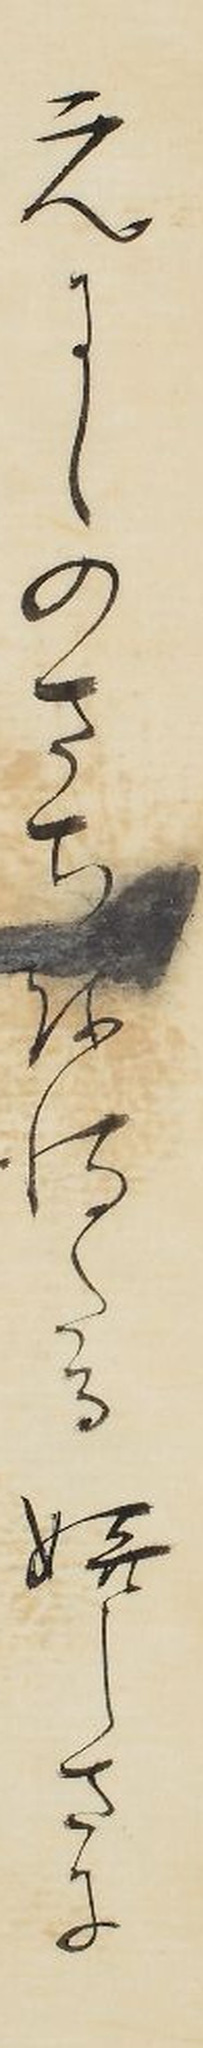えにしのさちを得たる嬉しさに
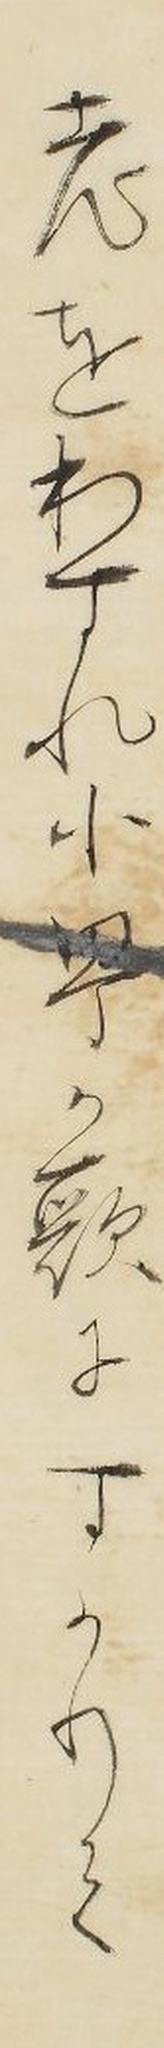老をわすれ小町か歌にすかりて
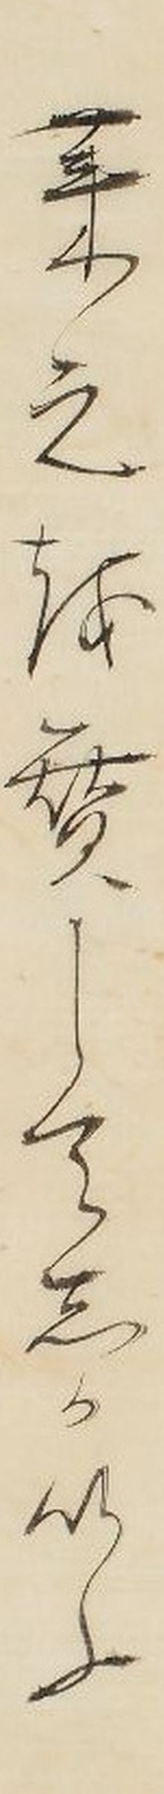某之を賛してしかいふ
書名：花土産
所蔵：徳島県立図書館
